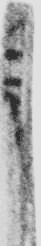羕（养）
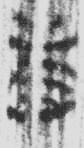眚（性）
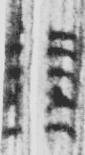者
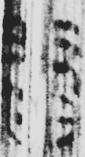習
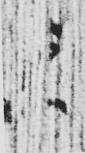也
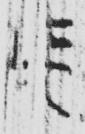長
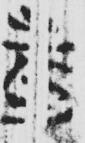眚（性）
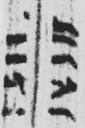者
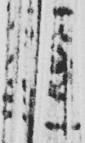道
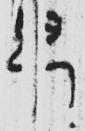也
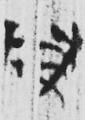凡
